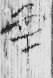辛
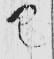巳
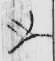之
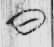日
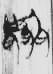臨
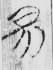昜（陽）
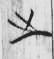之
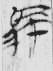馭（御）
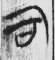司
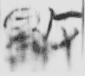敗
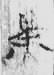黃
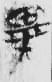異
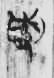受
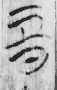○（期）
